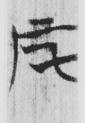厇
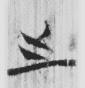之
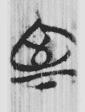室
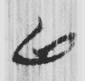㠯（以）
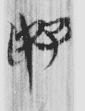好
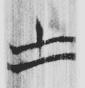士
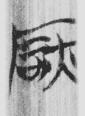庶
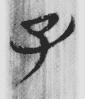子
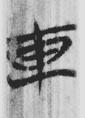車
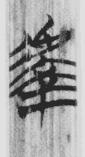{虍㚔}
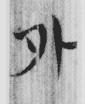外
